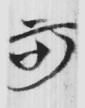可
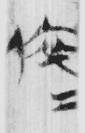依=
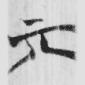亓
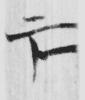下
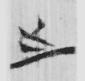之
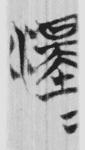{水日天土}=
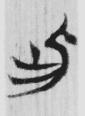此
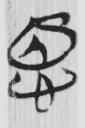{龴口人心}
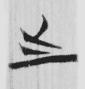之
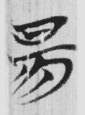昜
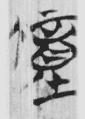僮
